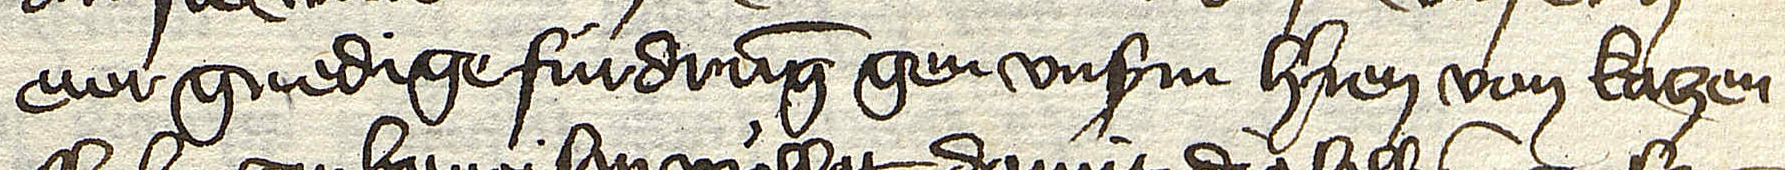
ewr gnedige fürdru*g gen vnſ*m h*ren von kacʒen
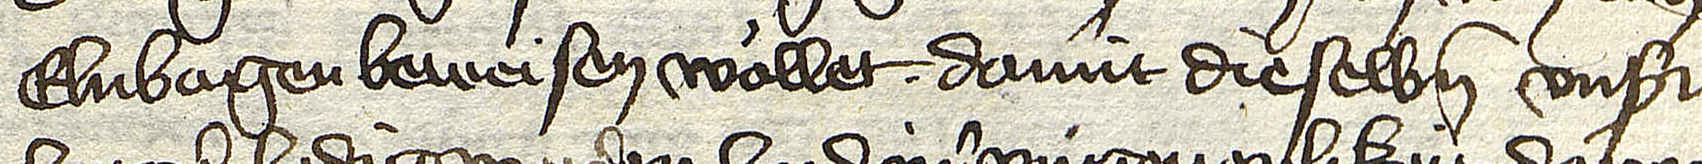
Elnbogen beweiſen wöllet . damit dieſelb*n vnſ*r
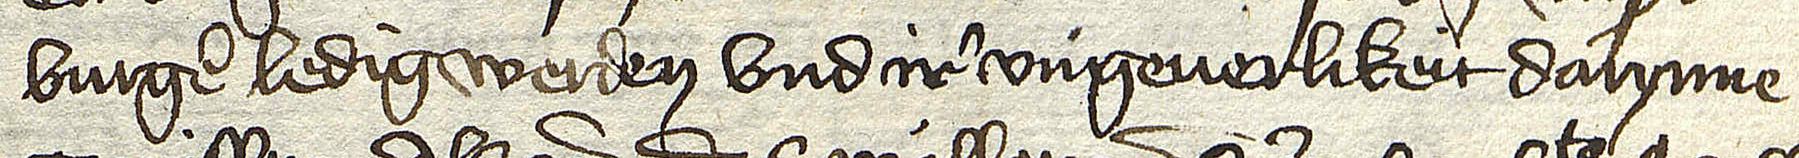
burge* ledig werden vnd ir* vngeuerlikeit darynne
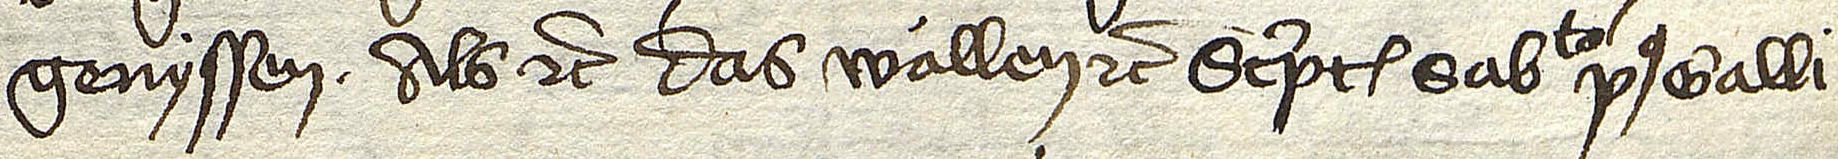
genyſſen . Als ec* das wöllen ec* Sc*pt* Sab* p* Galli
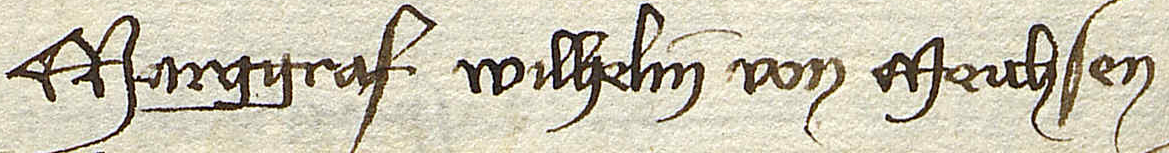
Marggraf wilhelm* von Meichſen
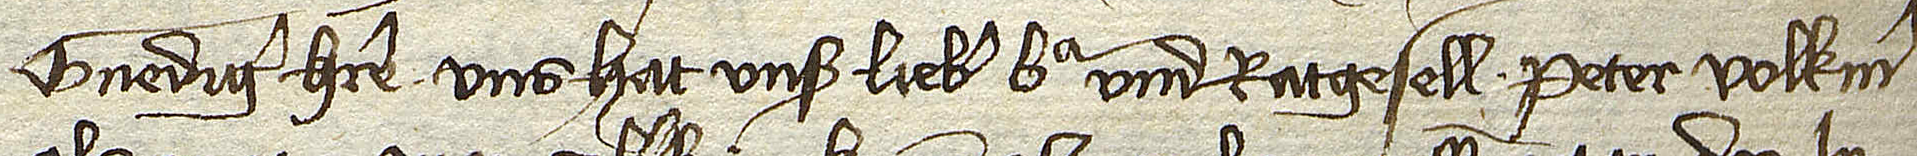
Gnedig* h*re . vns hat vnſ* lieb* b* vnd Ratgeſell . Peter volkm*
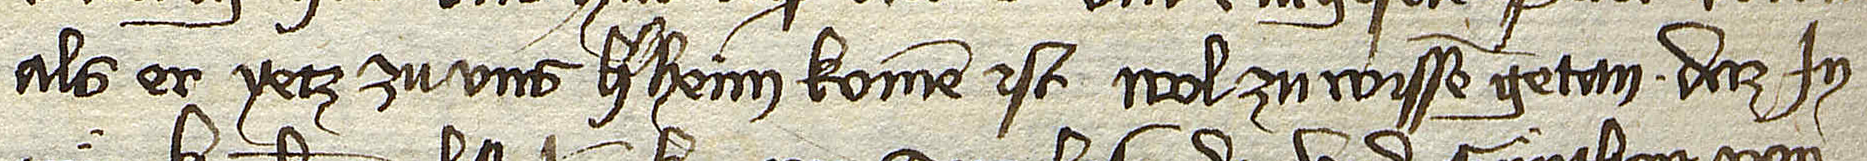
als er yecʒ ʒu vns h*heim kome* iſt wol ʒu wiſſe* getan . daʒ In
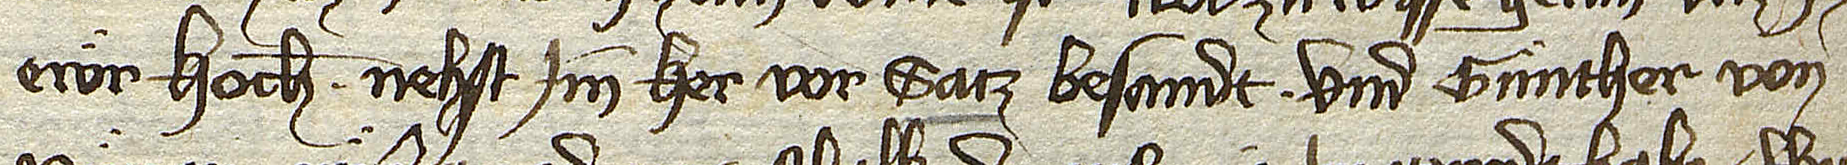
ewr Hoch* . nehſt Im* her vor Sacʒ beſandt . Vnd Günther von
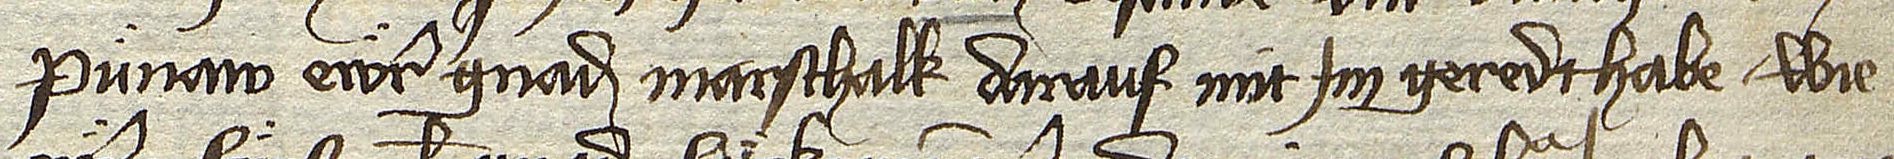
Pünaw ewr* gnad* marſchalk darauf mit Im geredt habe / wie
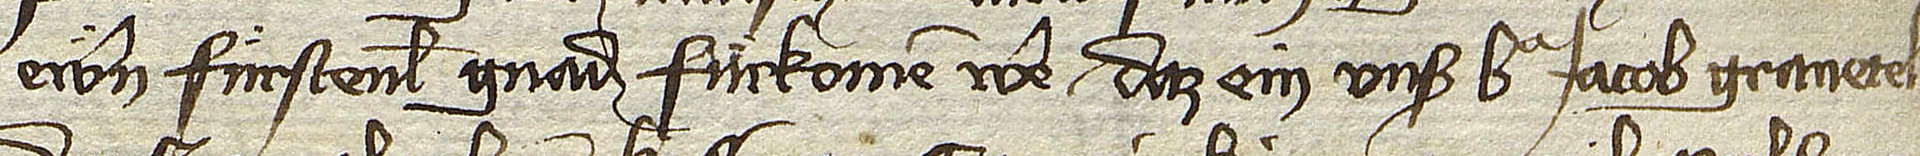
ew*n fürſtenl* gnad* fürkome* we* / daʒ ein vnſ* b* Iacob granetel
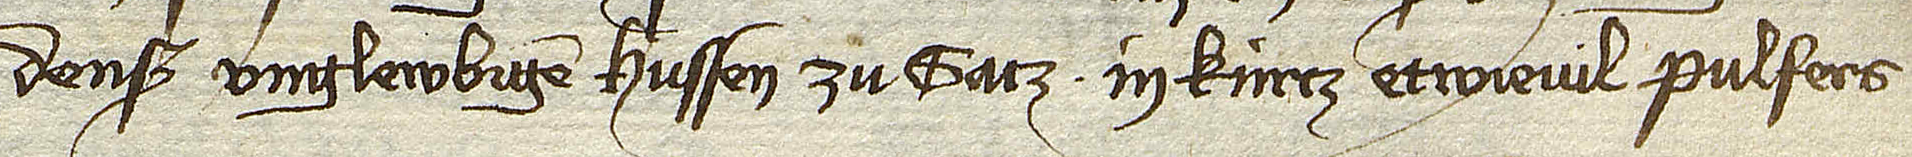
denſ* vngelewbige* huſſen ʒu Sacʒ . in kürcʒ ettwieuil Pulfers
